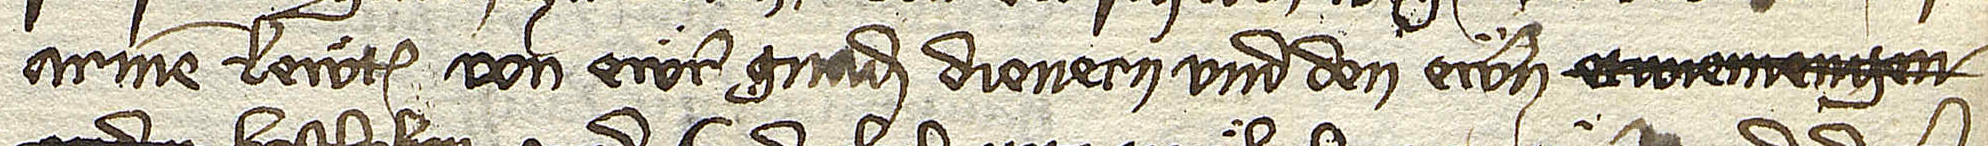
arme* leẅt* von eẅr* gnad* dienern vnd den eẅ*n etwiemengen
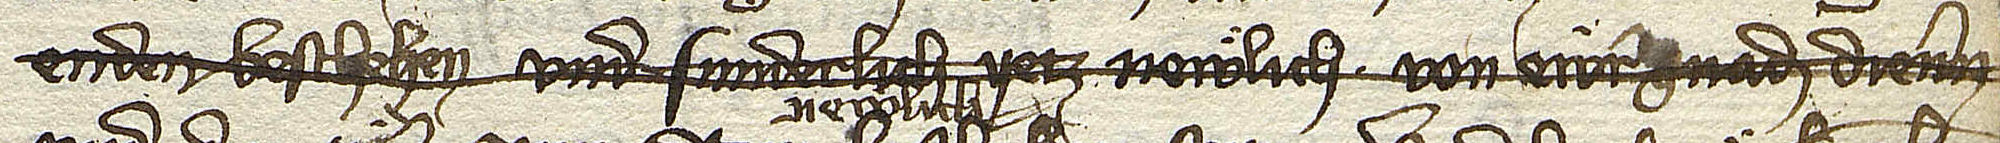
enden beſchehen vnd ſunderlich yecʒ neẅlich von eẅr* gnad* dien*n
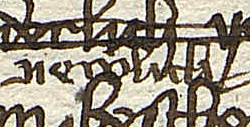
newlich
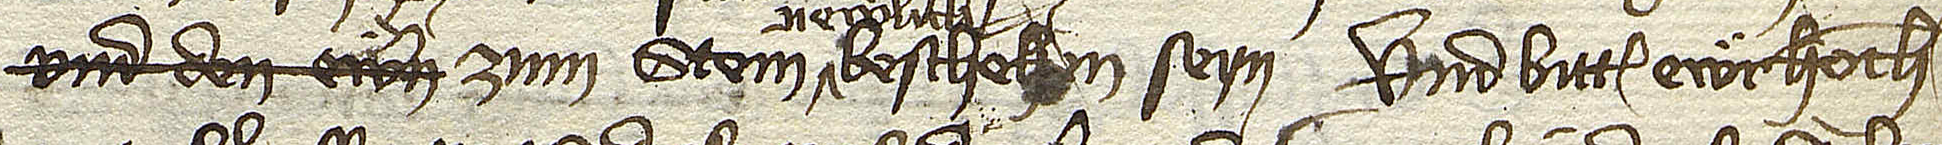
vnd den eẅ*n cʒum Stein beſchehen ſeyn Vnd bitt* eẅr* hoch*
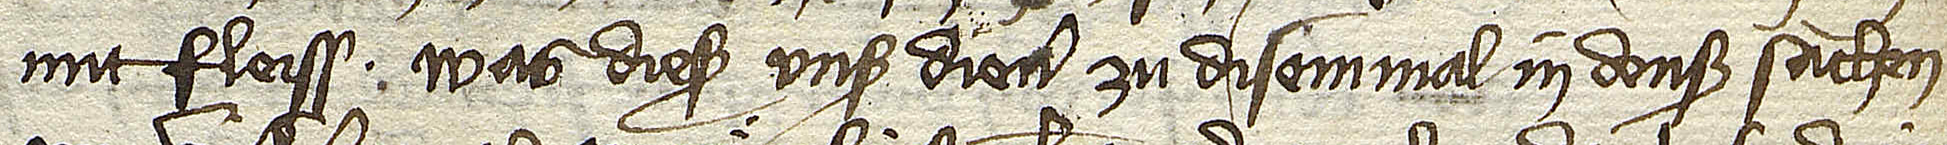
mit fleiſſ . was dieſ* vnſ* dien* ʒu diſem mal in denſ* ſachen
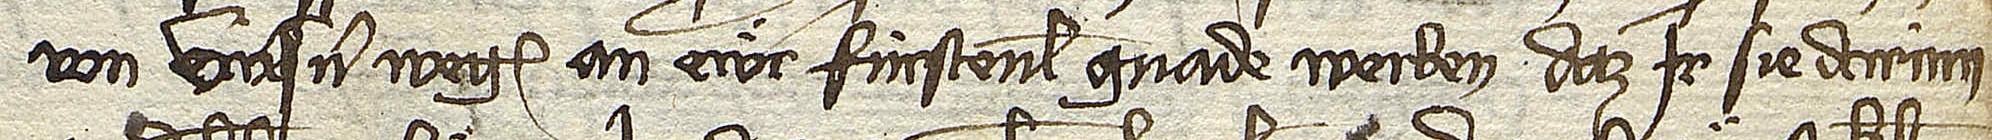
von Vnſn* weg* an eẅr fürſtenl* gnade werben daʒ Ir ſie darinn
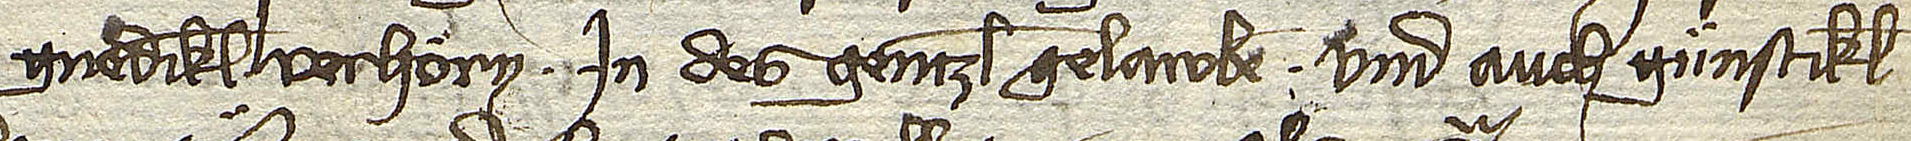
gnedikl* verhörn In des gencʒl* gelawbe . vnd auch günſtikl*
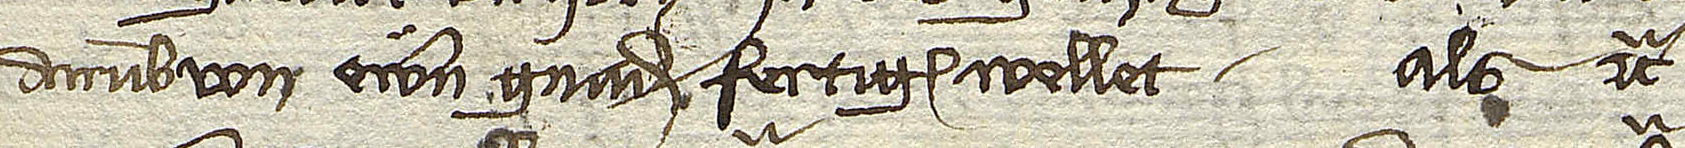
darub* von eẅ*n gnad* fertig* wellet / als ec*
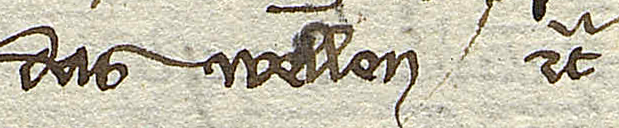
das wellen ec*
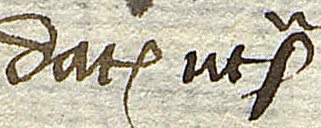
dat* ut ſ*
